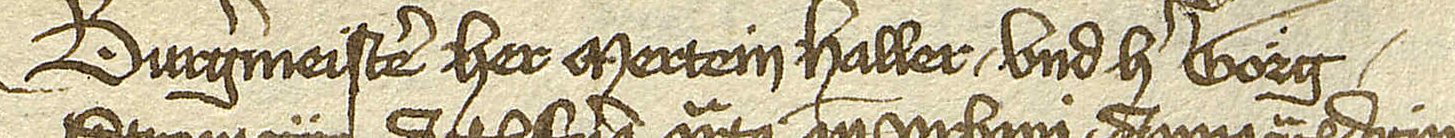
Burg*meiſte* her Mertein haller / vnd h* Görg /
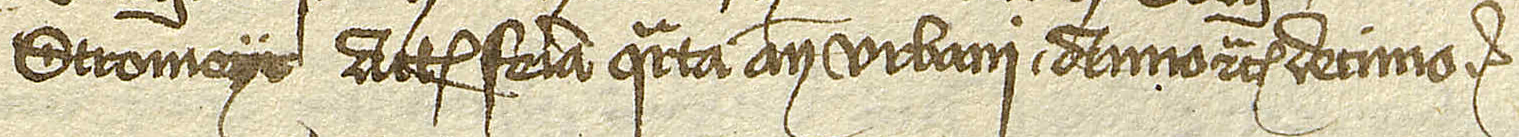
Stromeyr Act* feia* qrta* an* vrbani / Anno ec* decimo §
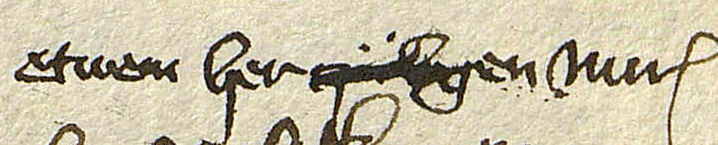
etwem her cʒü v gen Nur*
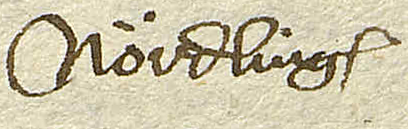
Nördling*
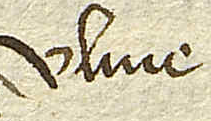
vlme
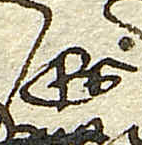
Es
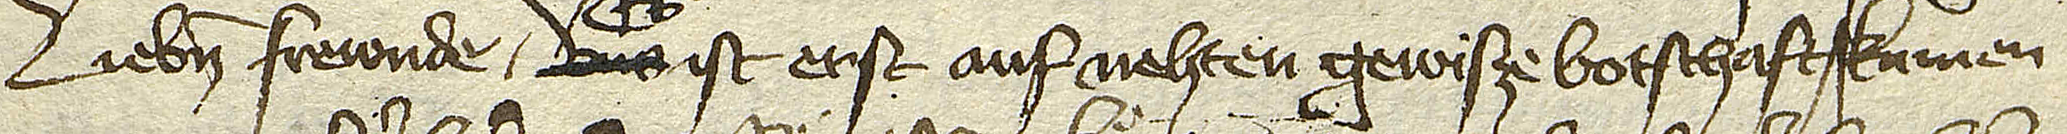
Liebn* frewnde / Vns iſt erſt auf nehten gewiſʒe botſchaft kumen
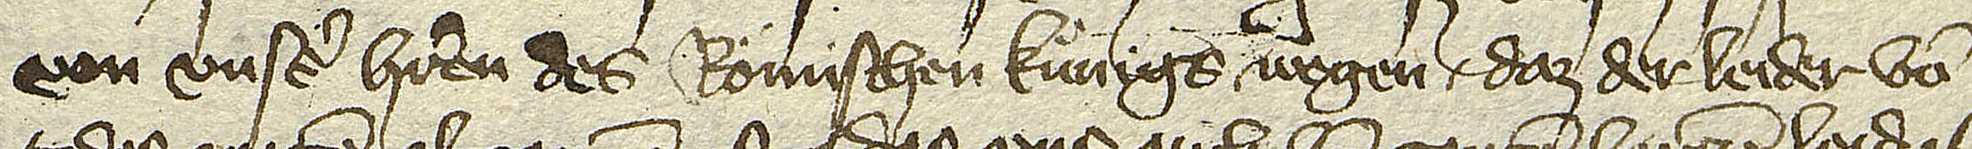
von vnſs* hr*en des Römiſchen künigs wegen / daʒ der leider vo*
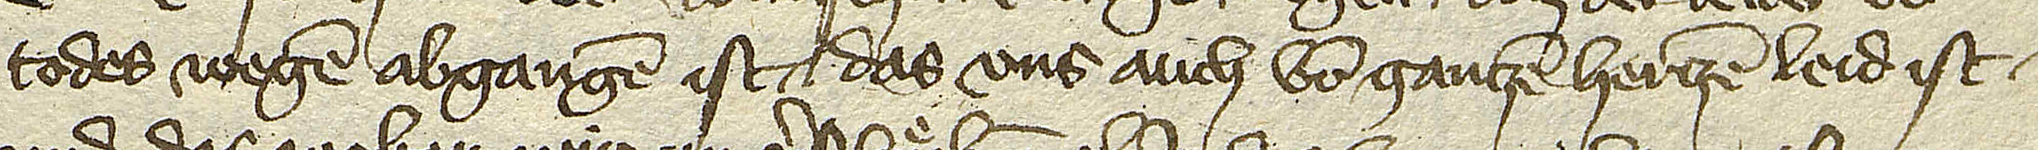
todes wege* abgange* iſt / das vns auch vo* gancʒe* herʒe* leid iſt /
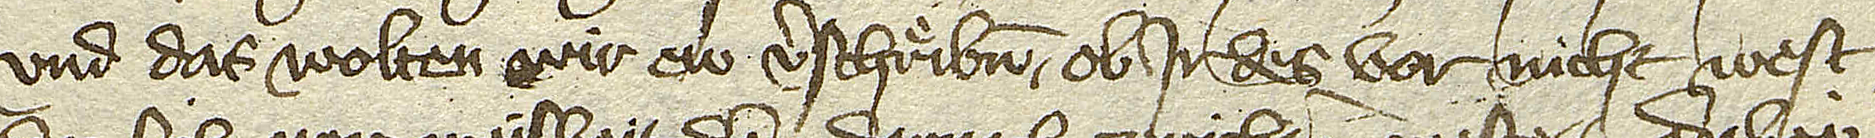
vnd das wolten wir ew v*ſchribn* / ob Ir des vor nicht weſt
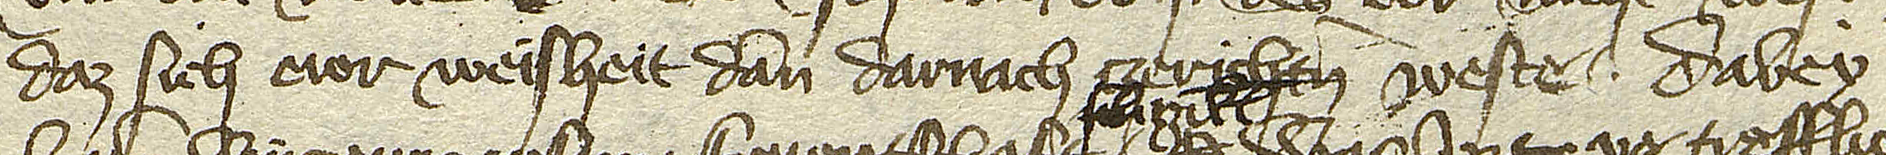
daʒ ſich ewr weiſheit dan* darnach cʒerichtn* weſte / . Dabey
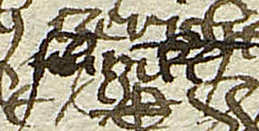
fliʒʒikl*
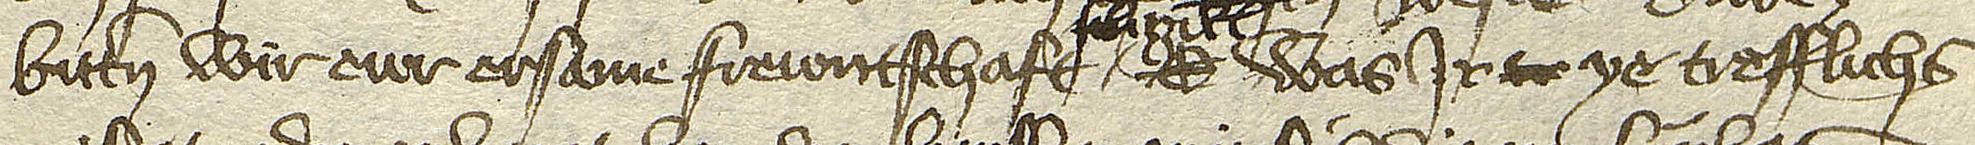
bittn* wir ewr erſame frewntſchaft / % Was Ir % ye trefflichs
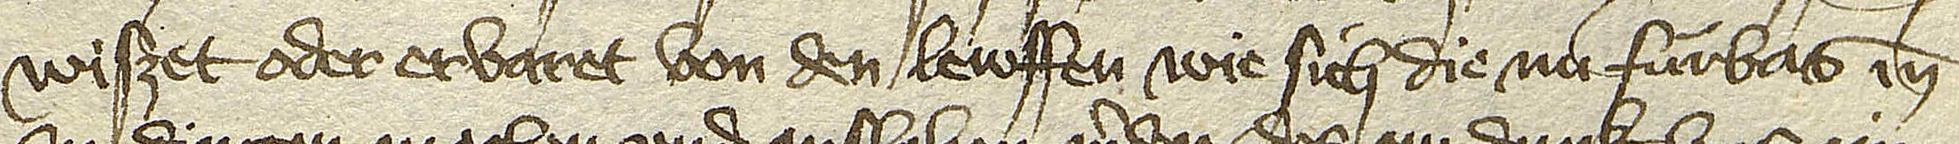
wiſʒet oder ervaret von den lewffen wie ſich die nu fürbas in
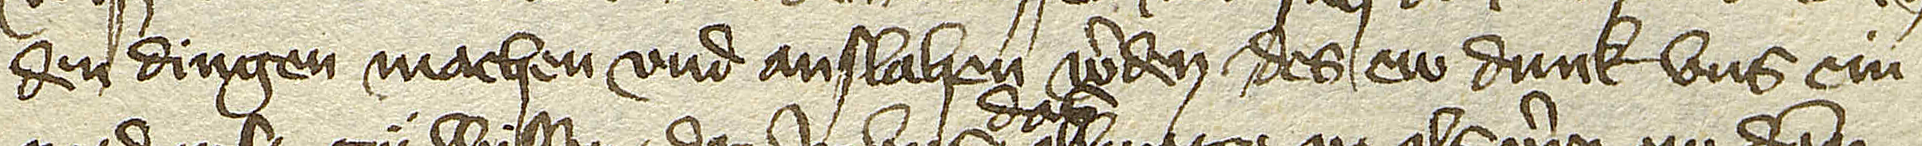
den dingen machen vnd anſlahen w*den / des ew dunk vns ein
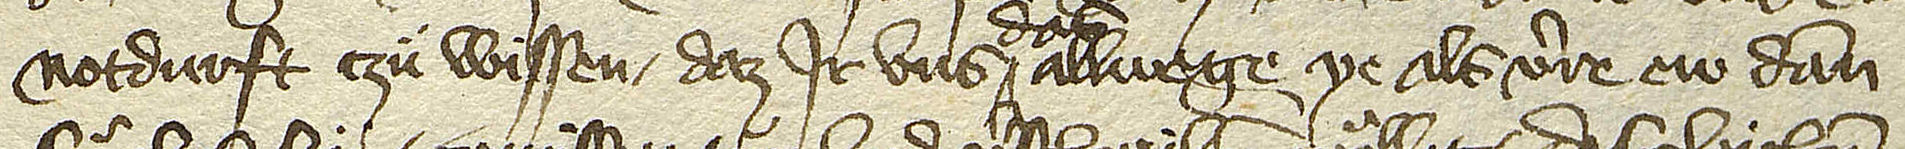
notdurft cʒü wiſſen / daʒ Ir vns allwege ye als v*re ew dan*
